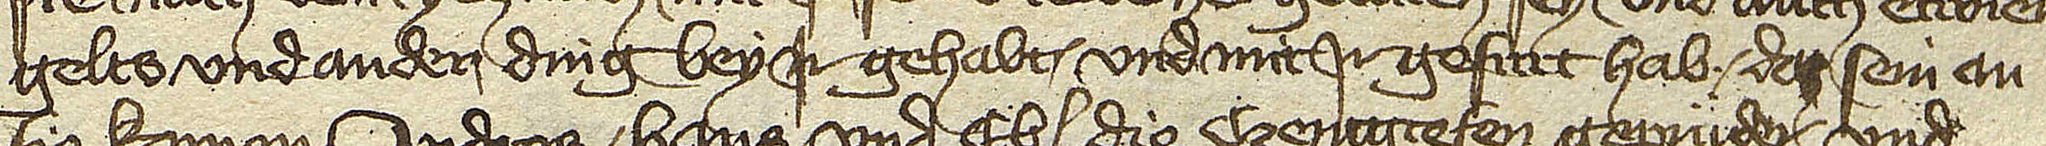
gelts vnd ander ding bey Ir gehabt / vnd mit Ir gefurt hab / dan ſein an
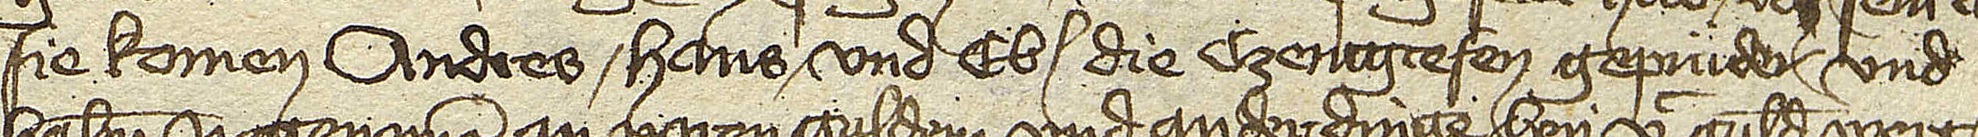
ſie komen Andres / hans / vnd Eb* die Cʒentgrefen geprüder vnd
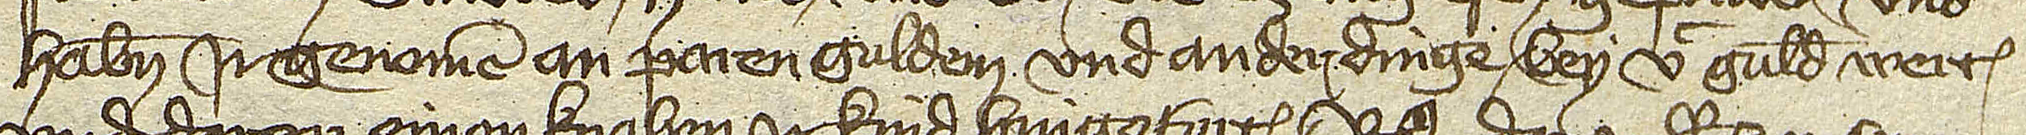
habn* Ir genome* an paren guldein vnd ander dinge / bey v* guld* wert*
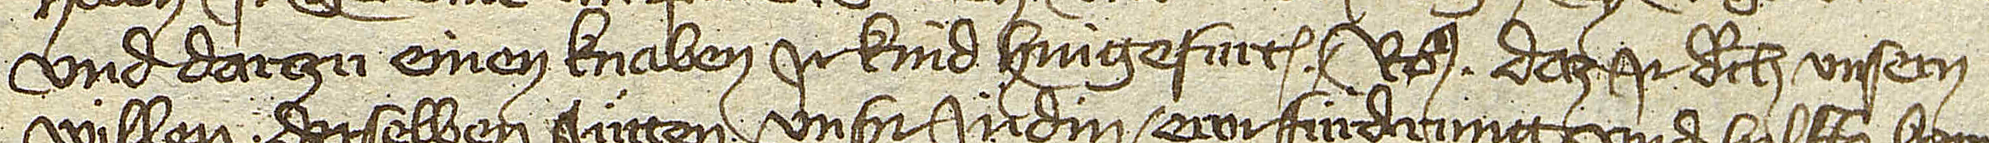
vnd darcʒu einen knaben Ir kind hingefurt* . / Ro*. daʒ Ir d*ch vnſern
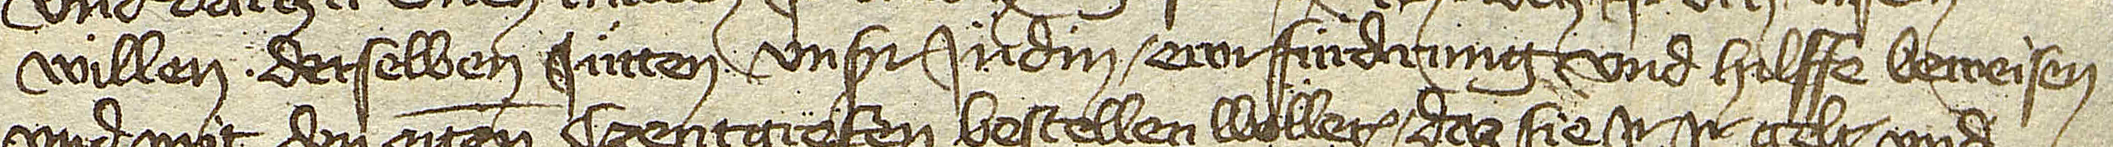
willen derſelben Iütten vnſ*r Iüdin / ewr fürdrung vnd hilffe beweiſen
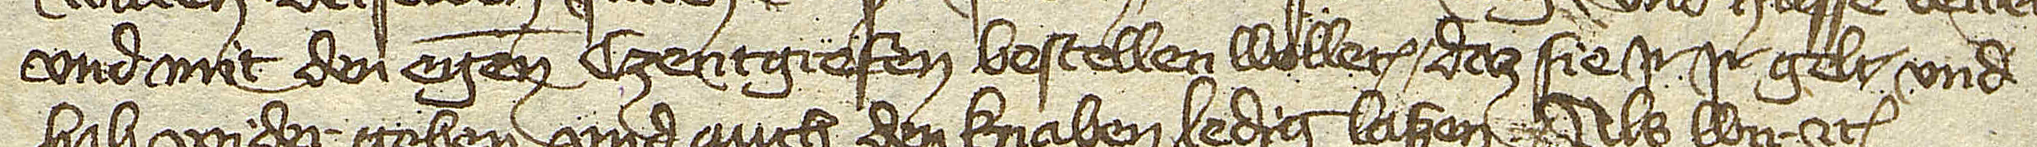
vnd mit den egen* Cʒentgrefen beſtellen wöllet / daʒ ſie Ir gelt vnd
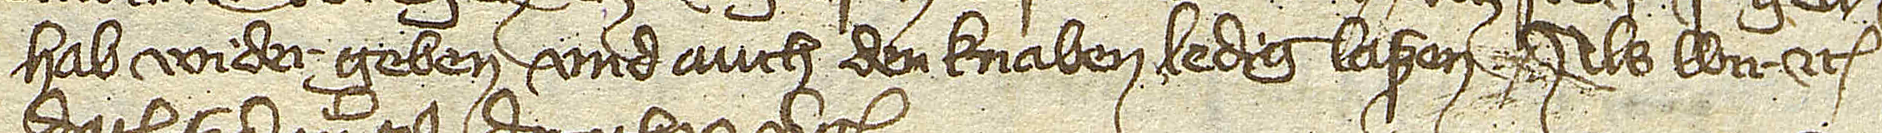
hab wider geben vnd auch den knaben ledig laſʒen / Als wir ec*
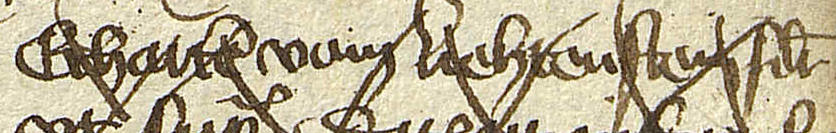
Erharte* vom liehtenſtein ſilr*
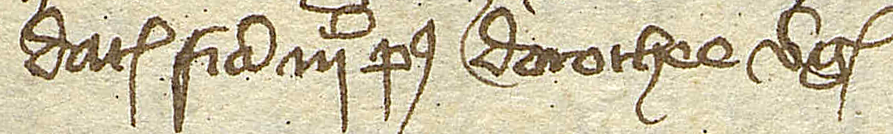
dat* fia* iii* p* dorothee v*g*
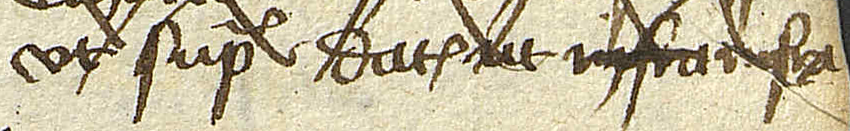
vt ſup* dat* ut infra infra
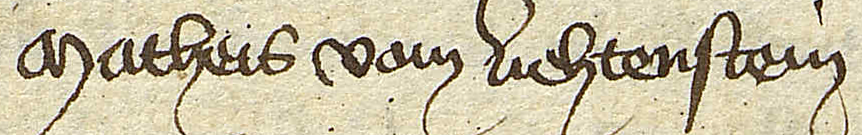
Matheis vom Liehtenſtein
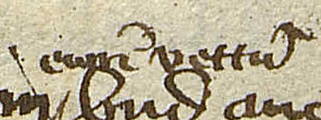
ewre* vettn*
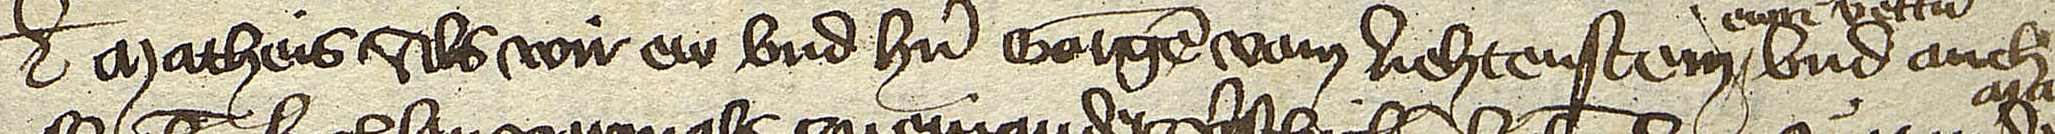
L* Matheis / Als wir ew vnd hn* Gorge* vom liehtenſtein vnd auch
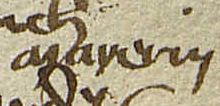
Mayerin
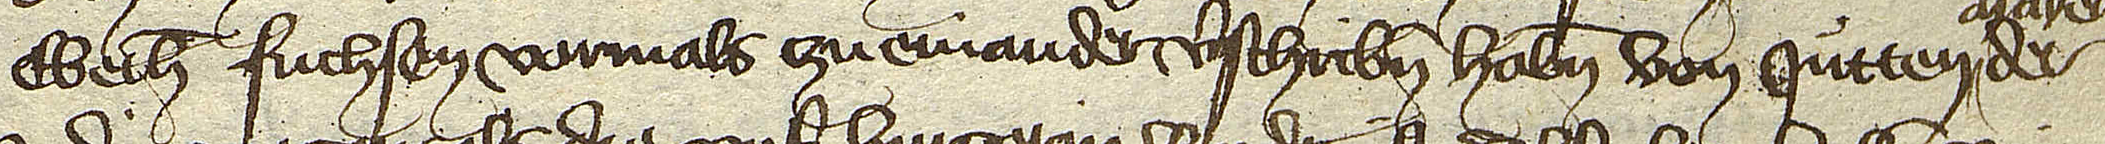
Eberh* fuchſen vormals cʒu einander v*ſchribn* habn* von Iütten der
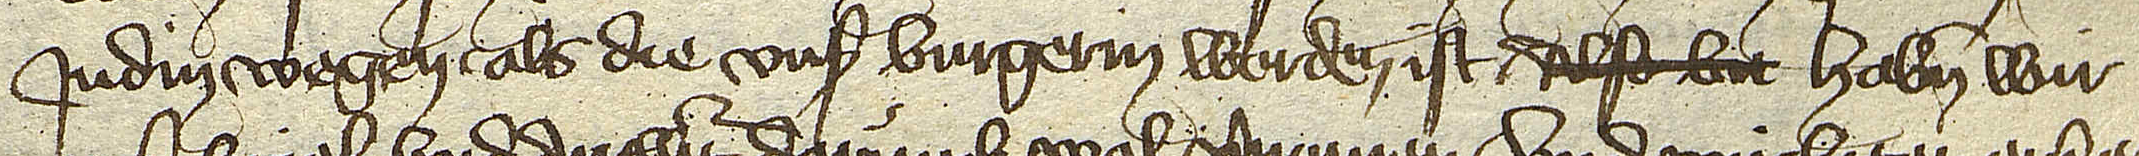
Iudin wegen / als die vnſ* burgerin worden iſt / Alſo bit habn* wir
